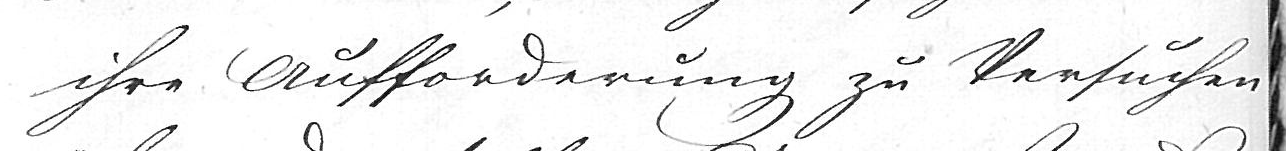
ihre Aufforderung zu Versuchen
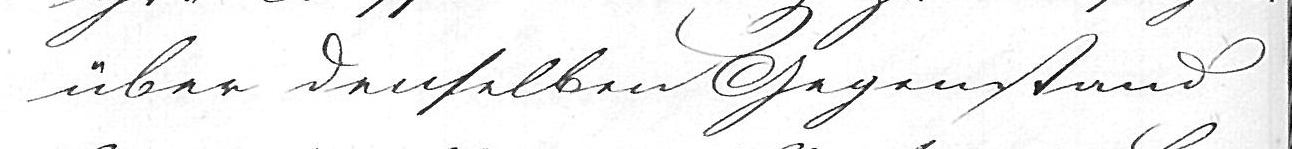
über denselben Gegenstand
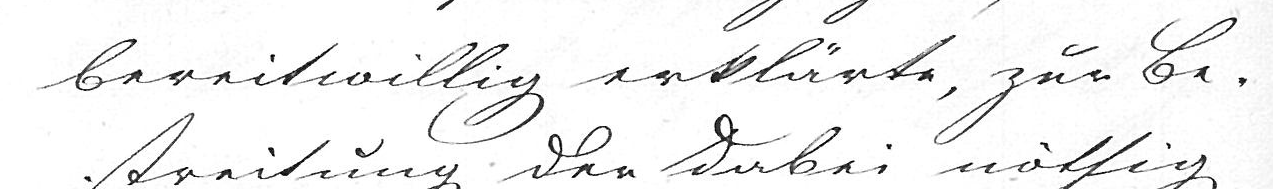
bereitwillig erklärte, zur Be-
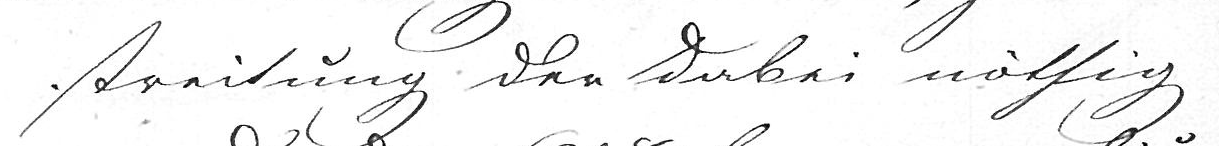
streitung der dabei nöthig
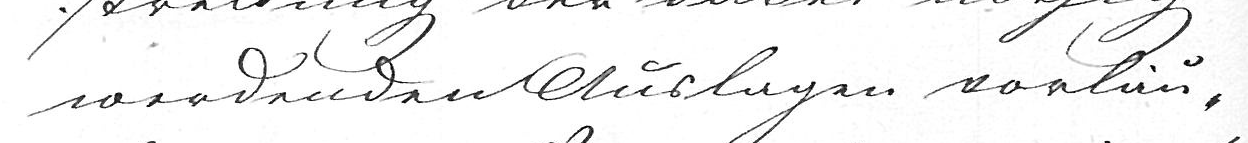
werdenden Auslagen vorläu-
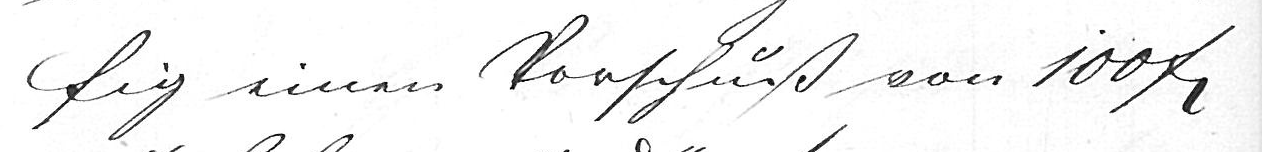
fig einen Vorschluß von 100 fl
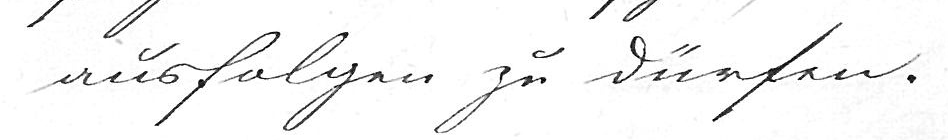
ausfolgen zu dürfen.
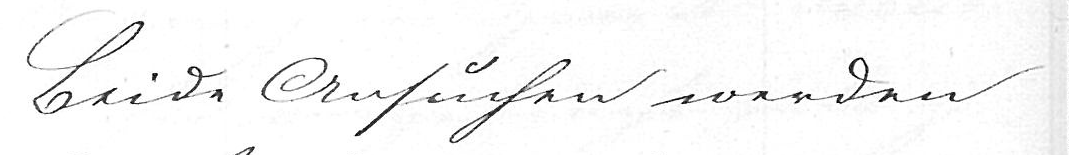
Beide Ansuchen werden
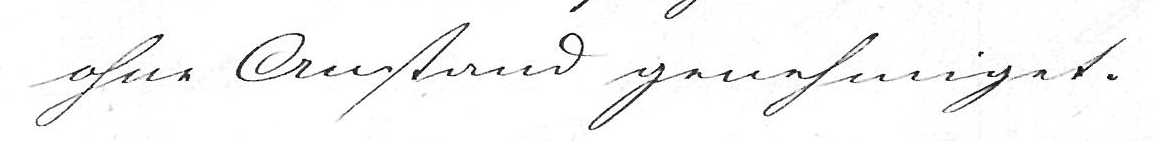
ohne Anstand genehmiget.
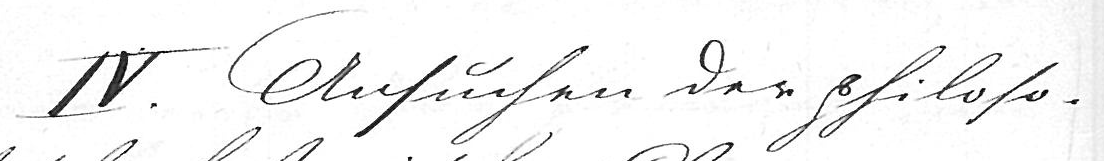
IV. Ansuchen der philoso-
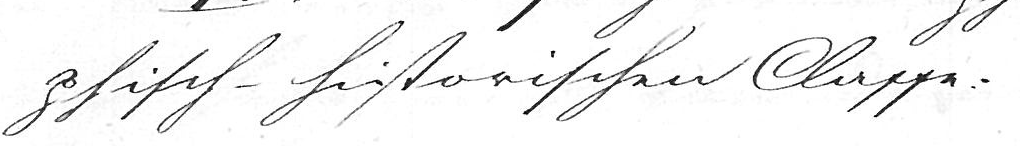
phisch-historischen Classe.
